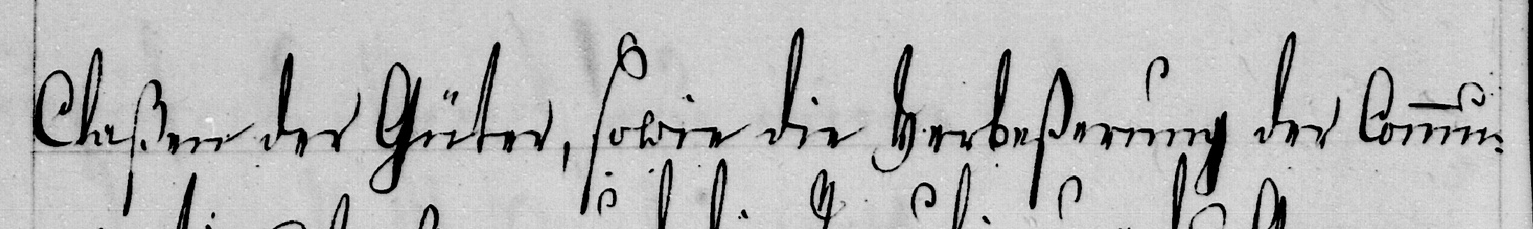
Claßen der Güter, sowie die Verbeßerung der Commu¬
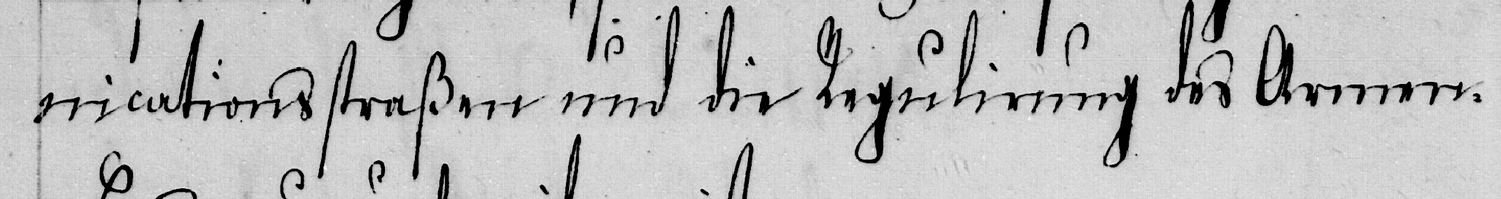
nicationsstraßen und die Regulirung des Armen¬
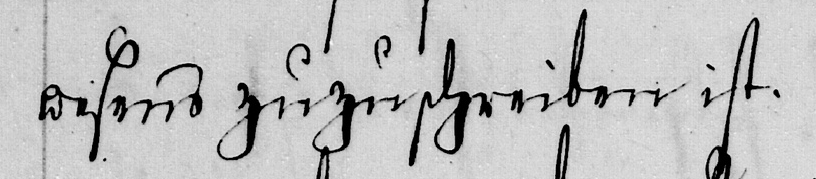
wesens zuzuschreiben ist.
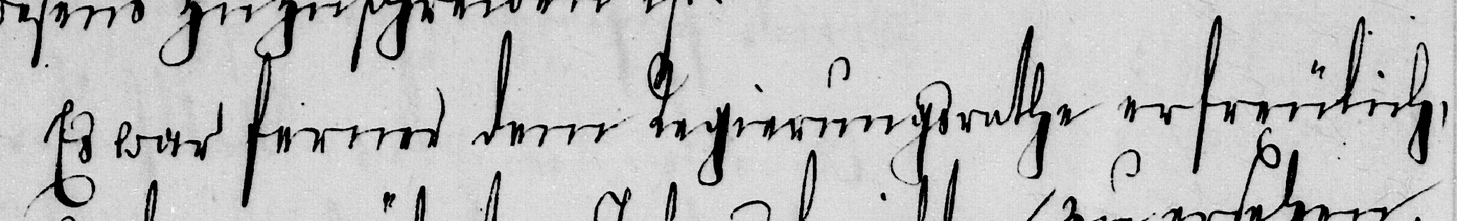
Es war ferner dem Regierungsrathe erfreulich,
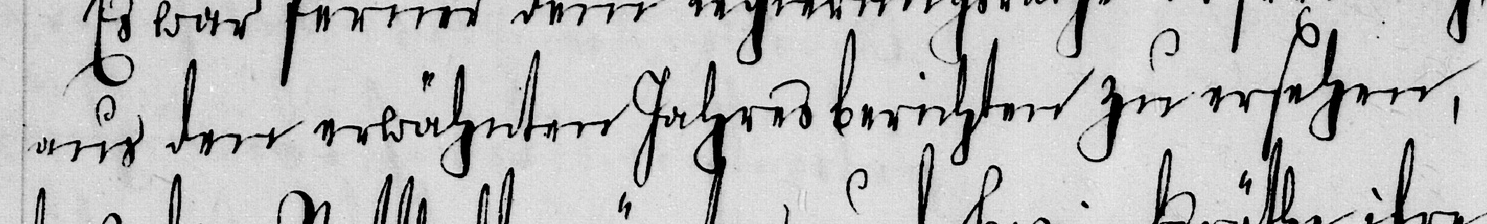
aus den erwähnten Jahresberichten zu ersehen,
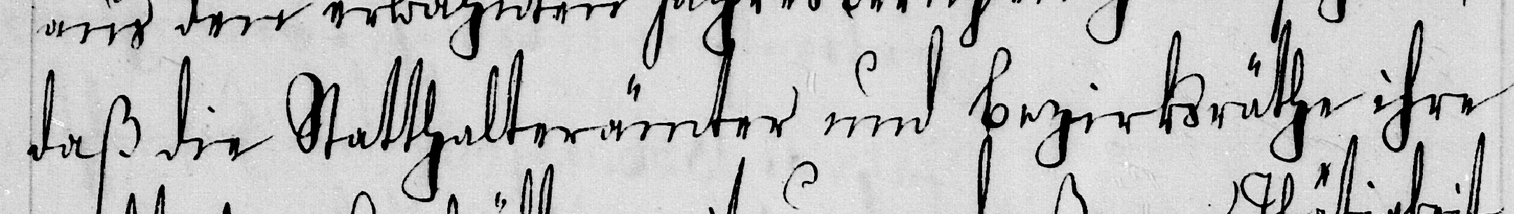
daß die Statthalterämter und Bezirksräthe ihre
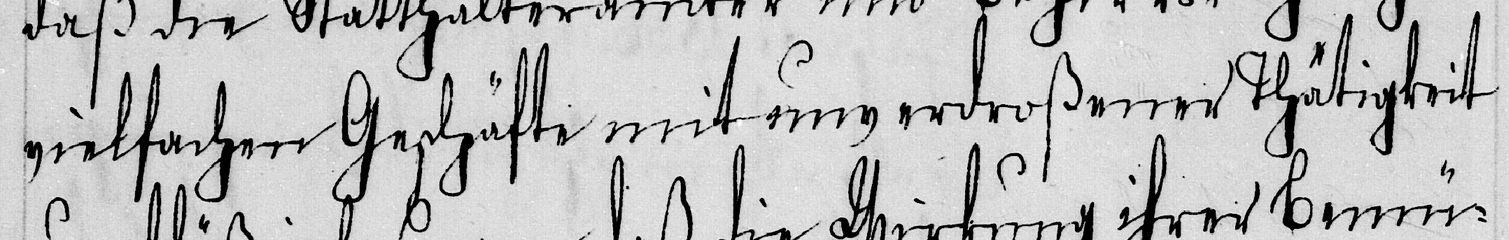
vielfachen Geschäfte mit unverdroßener Thätigkeit
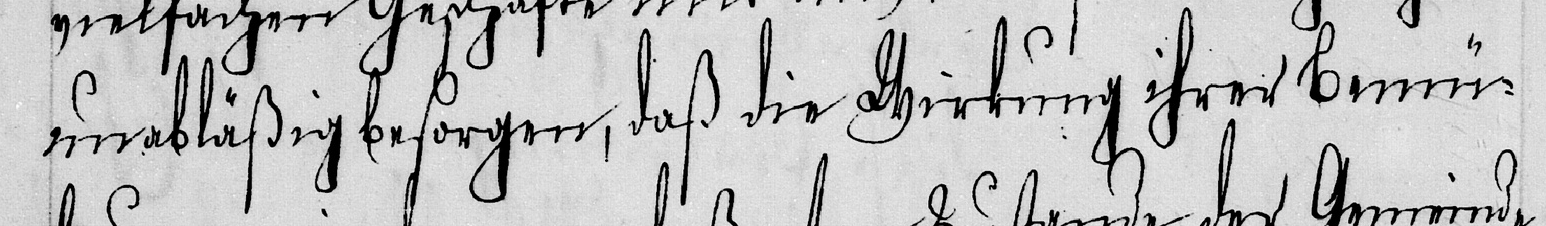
unabläßig besorgen, daß die Wirkung ihrer Bemü¬
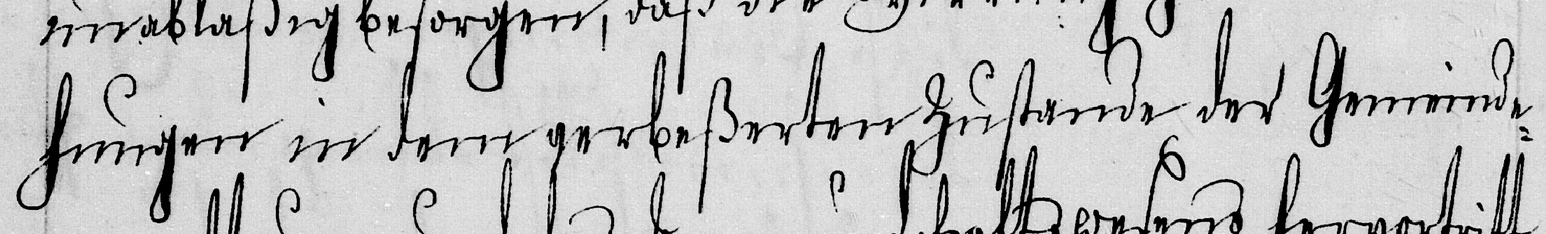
hungen in dem verbeßerten Zustande der Gemeinde¬
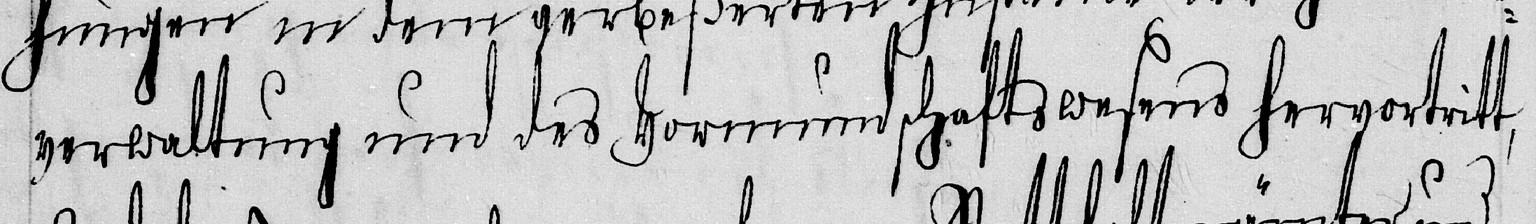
verwaltung und des Vormundschaftswesens hervortrit¬
